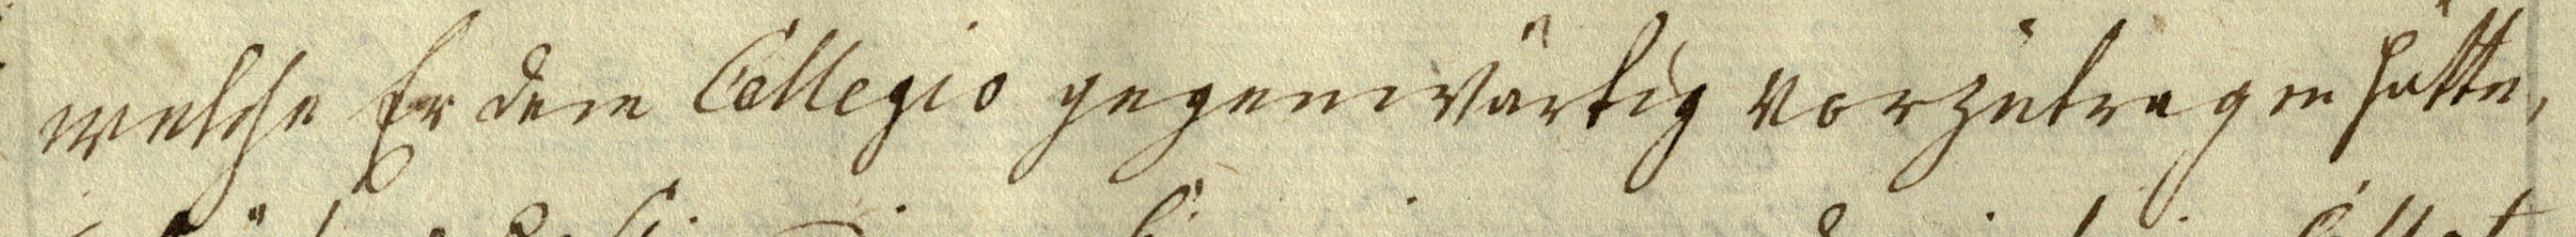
welche Er dem Collegio gegenwärtig vorzutragen hätte,
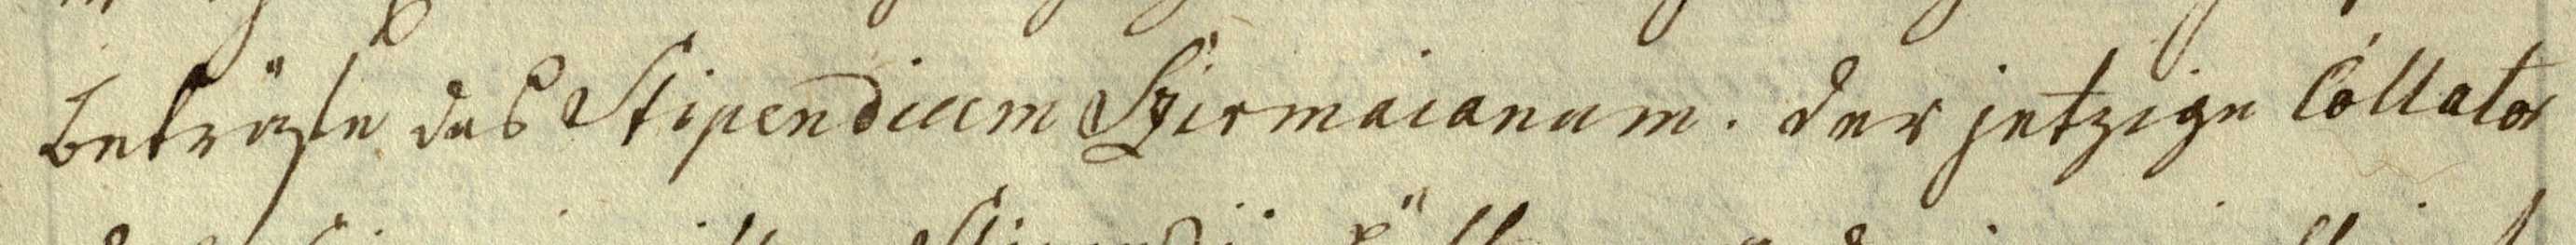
beträfe das Stipendium Szirmaianum. Der jetzige Collator
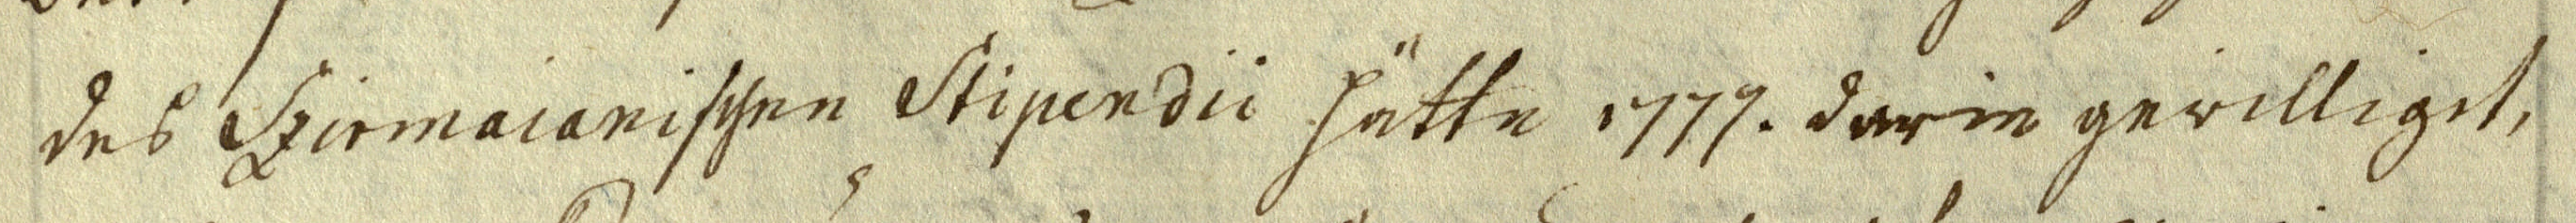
des Szirmaianischen Stipendii hätte 1777. darin gewilliget,
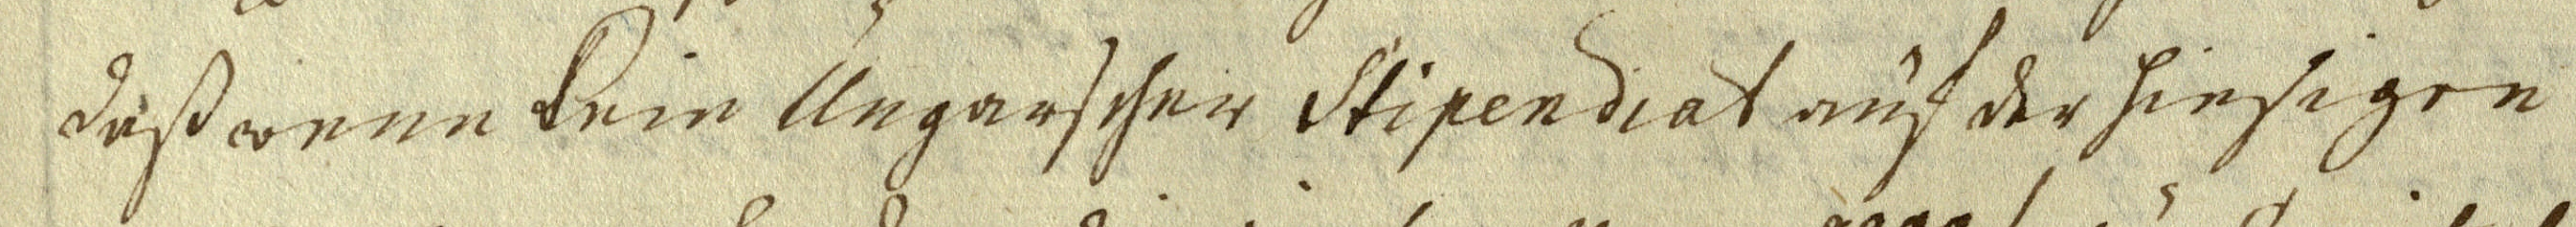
daß wenn kein Ungarscher Stipendiat auf der hiesigen
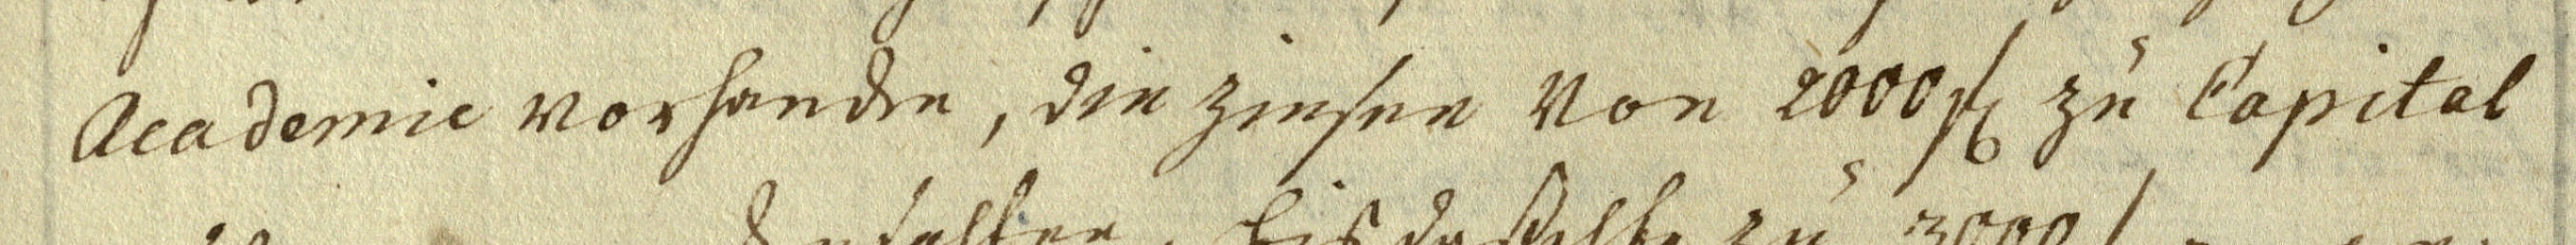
Academie vorhanden, die Zinsen von 2000 s zu Capital
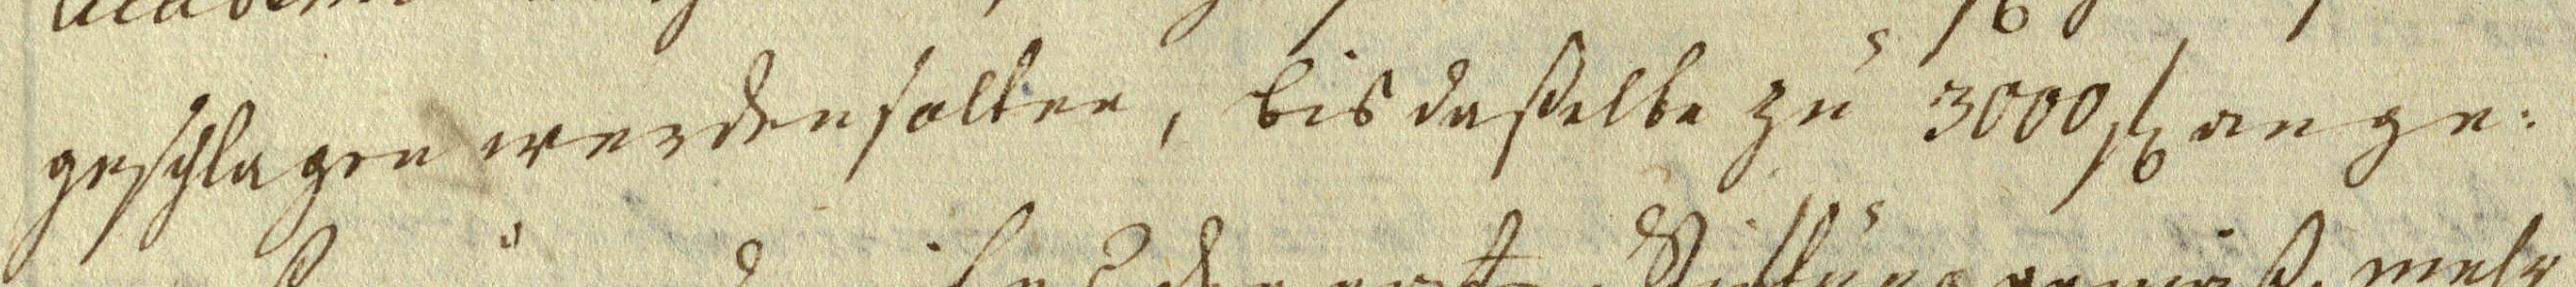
geschlagen werden solten, bis daßelbe zu 3000 s an ge¬
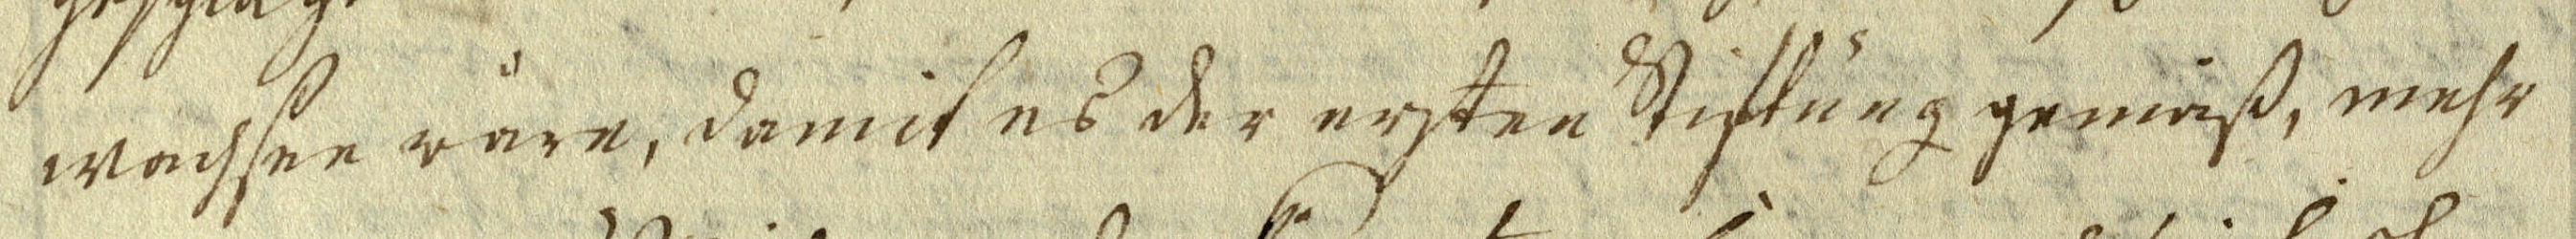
wachsen wäre, damit es der ersten Stiftung gemäß, mehr
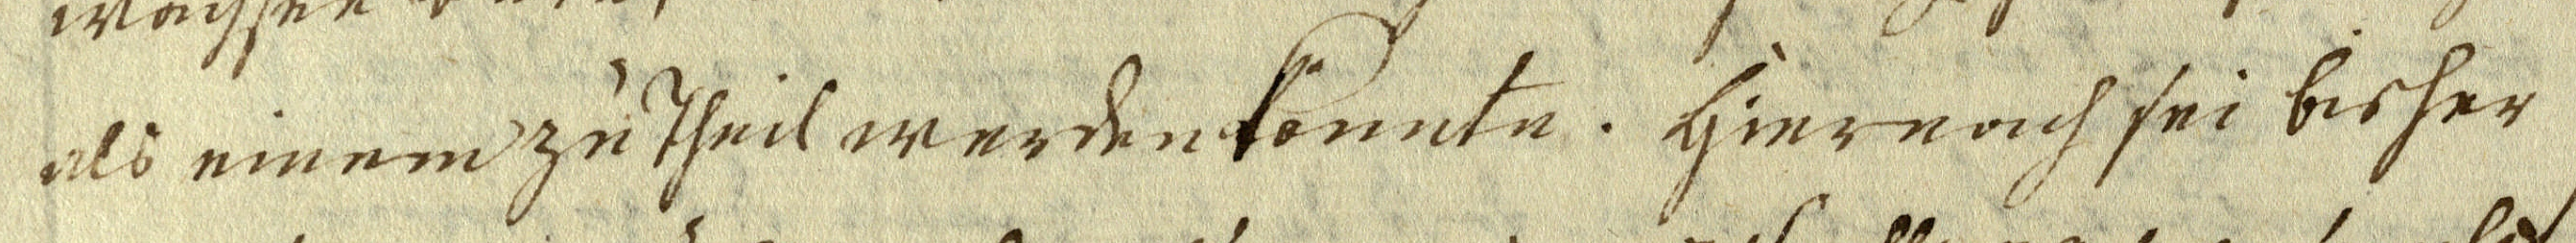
als einem zu Theil werden könnte. Hiernach sei bisher
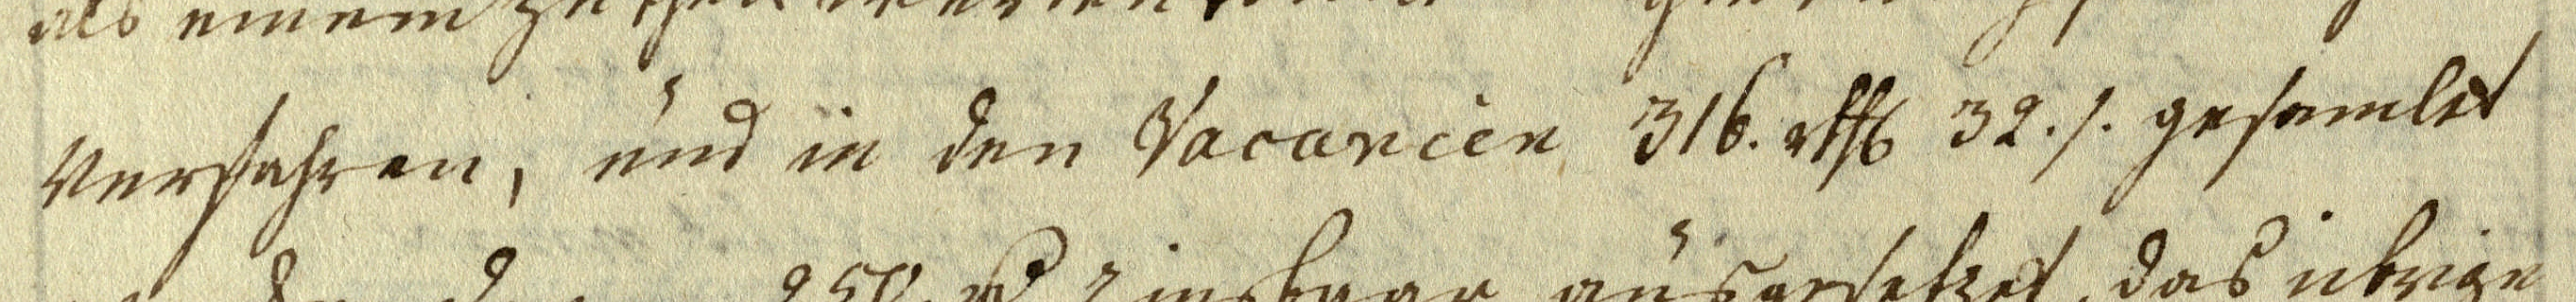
verfahren, und in den Vacarien 316. rtl. 32. s. gesamlet
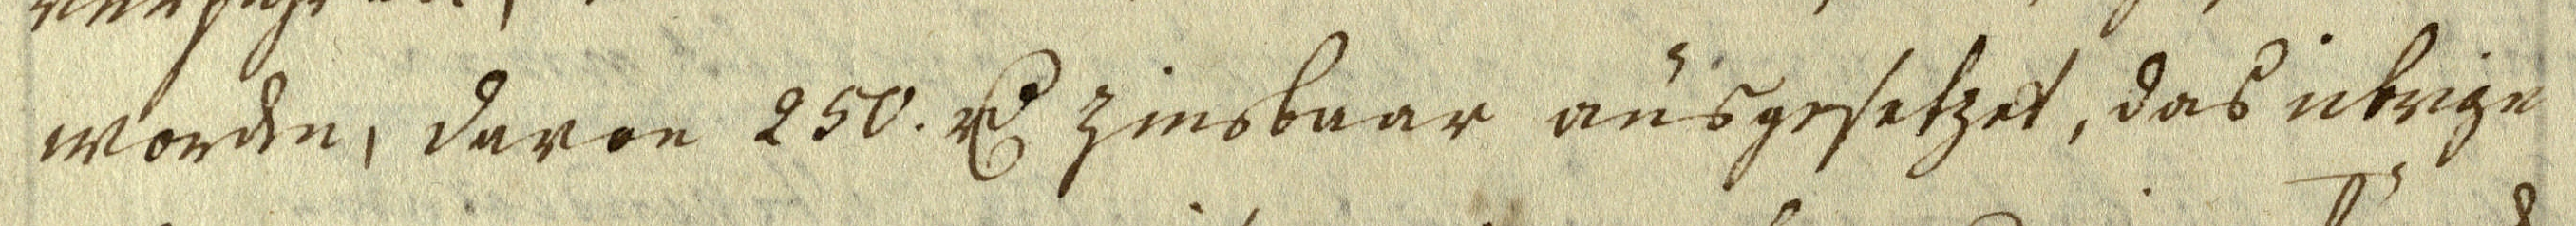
worden, davon 250. r zinsbaar ausgesetzet, das übrige
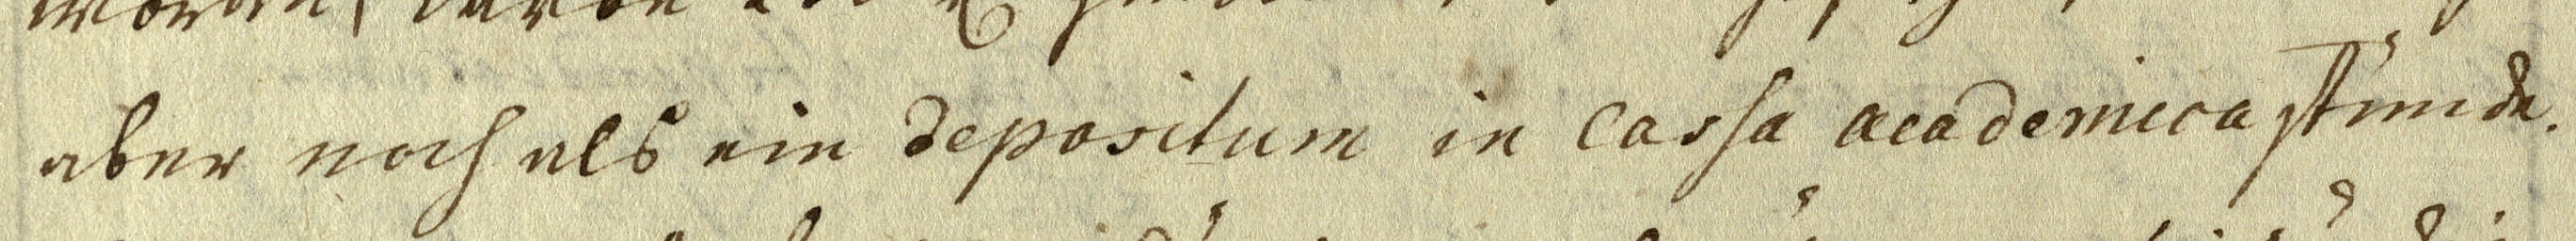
aber noch als ein depositum in cassa academica stünde.
